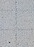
R.
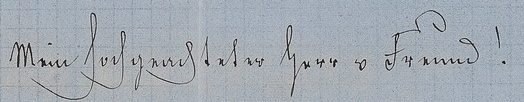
Mein hochgeachteter Herr & Freund!
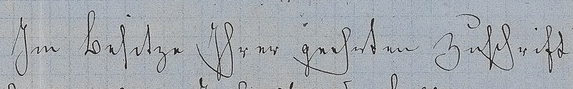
Im Besitze Ihrer geehrten Zuschrift
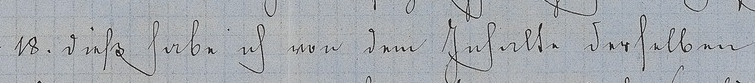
18. dieß habe ich von dem Inhalte derselben
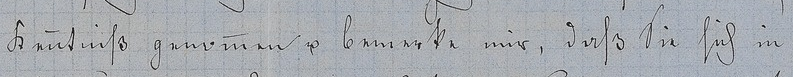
Kenntniß genommen & bemerke nur, daß Sie sich in
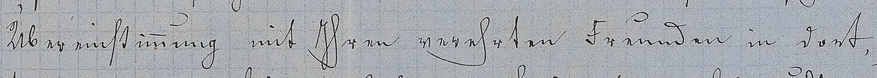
Übereinstimmung mit Ihren verehrten Freunden in dort,
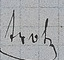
trotz
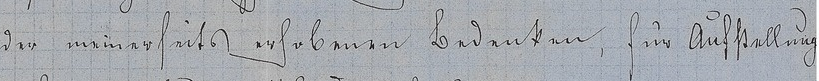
der meinerseits erhobenen Bedenken, für Aufstellung
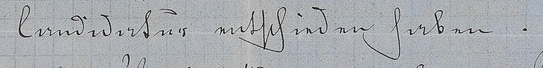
Canditatur entschieden haben.
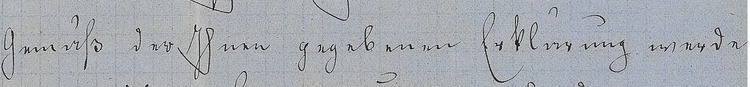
Gemäß der Ihnen gegebenen Erklärung werde
